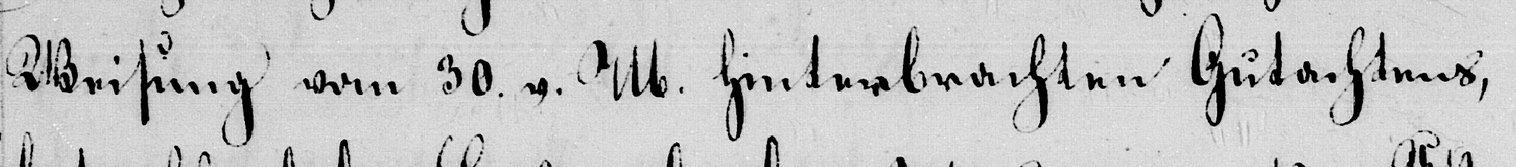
Weisung vom 30. v. M. hinterbrachten Gutachtens,
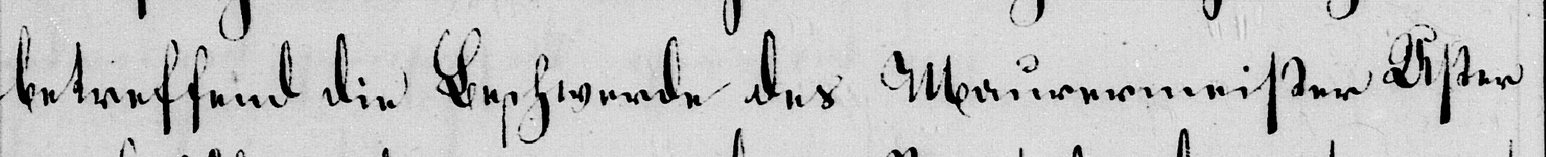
betreffend die Beschwerde des Maurermeister Uster
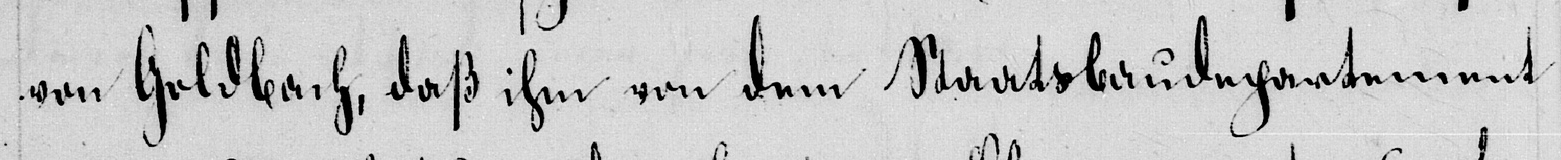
von Goldbach, daß ihm von dem Staatsbaudepartement
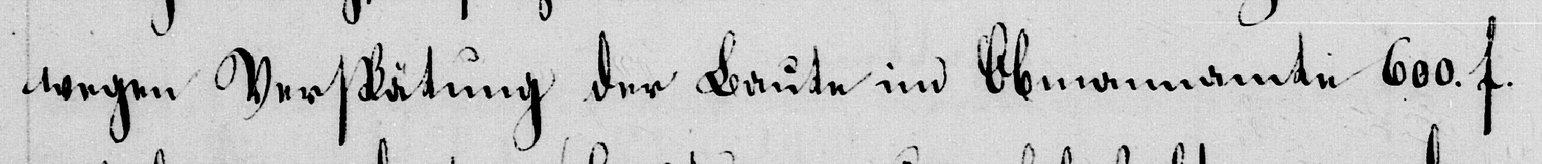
wegen Verspätung der Baute im Obmannamte 600. f.
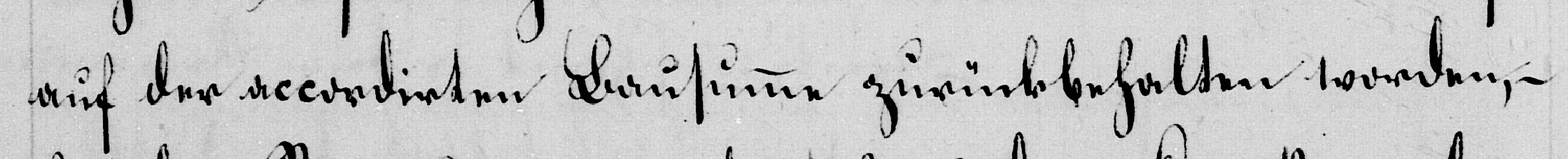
auf der accordirten Bausumme zurückbehalten worden, –
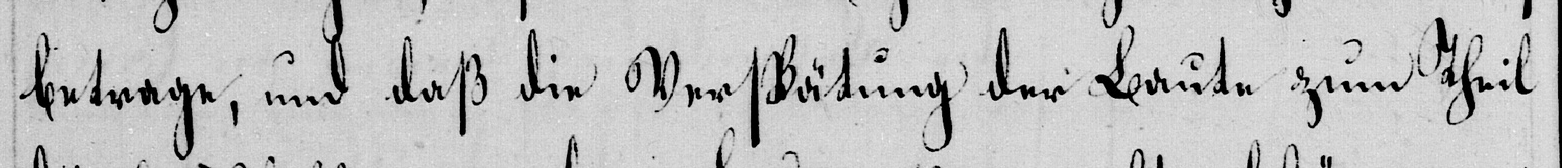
betrage, und daß die Verspätung der Baute zum Theil
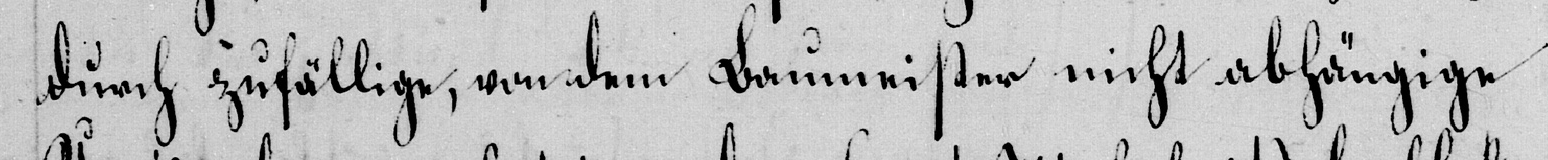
durch zufällige, von dem Baumeister nicht abhängige
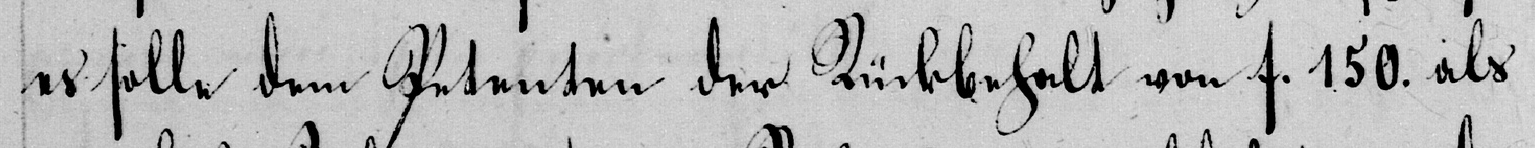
es solle dem Petenten der Rückbehalt von f. 150. als
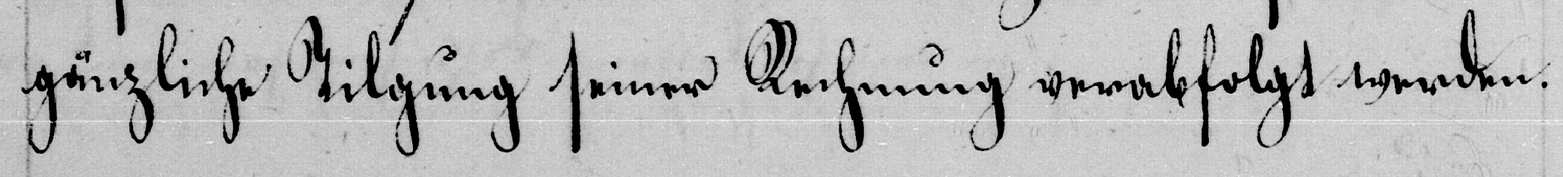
gänzliche Tilgung seiner Rechnung verabfolgt werden.
